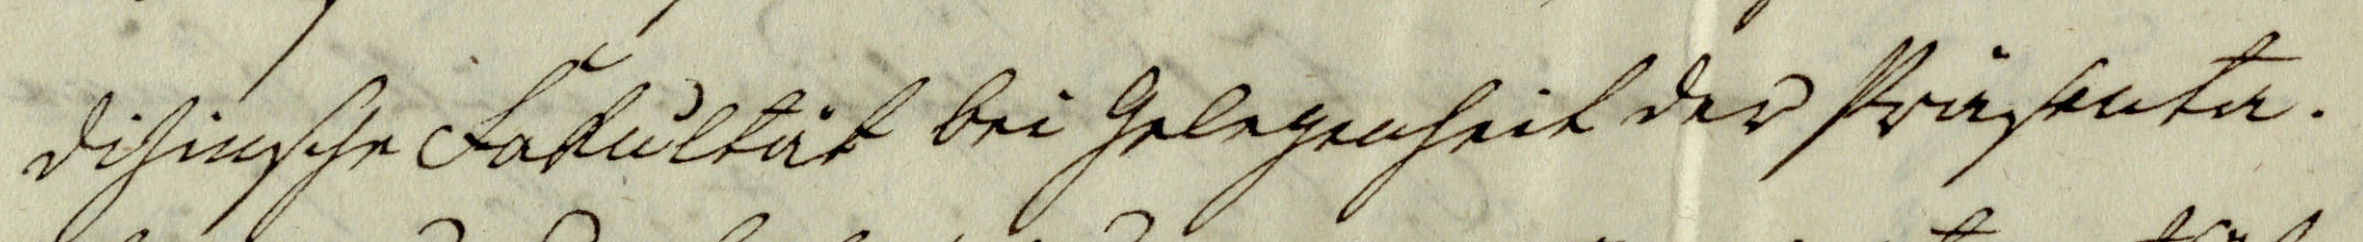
dizinische Fakultät bei Gelegenheit der Präsenta¬
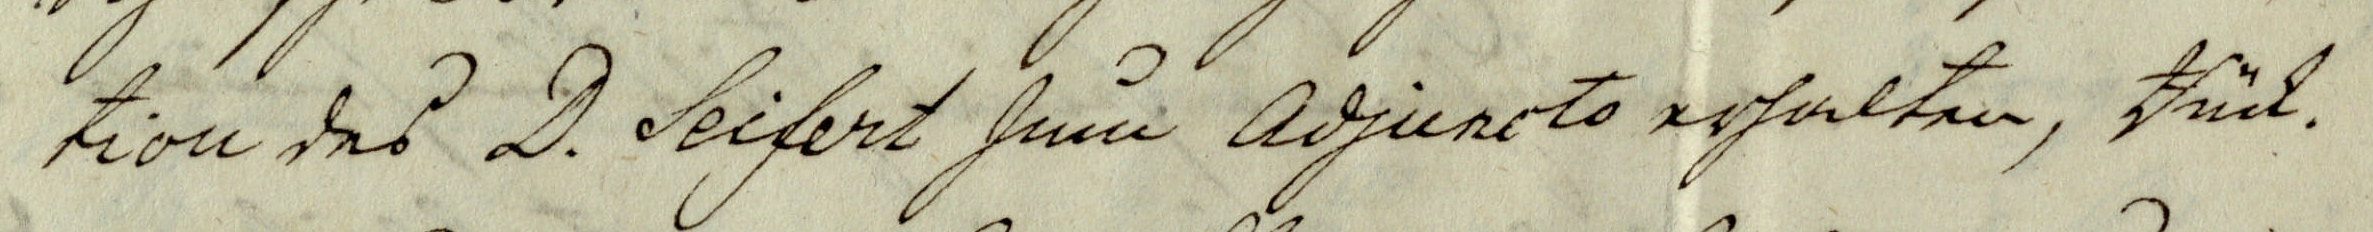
tion des D. Seifert zum Adjuncto erhalten, Rück¬
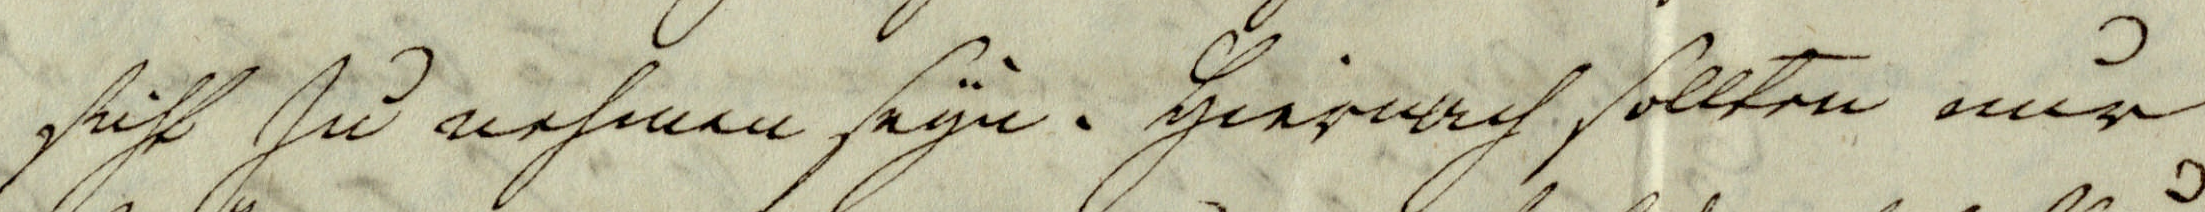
sicht zu nehmen seÿn. Hierauf sollten nur
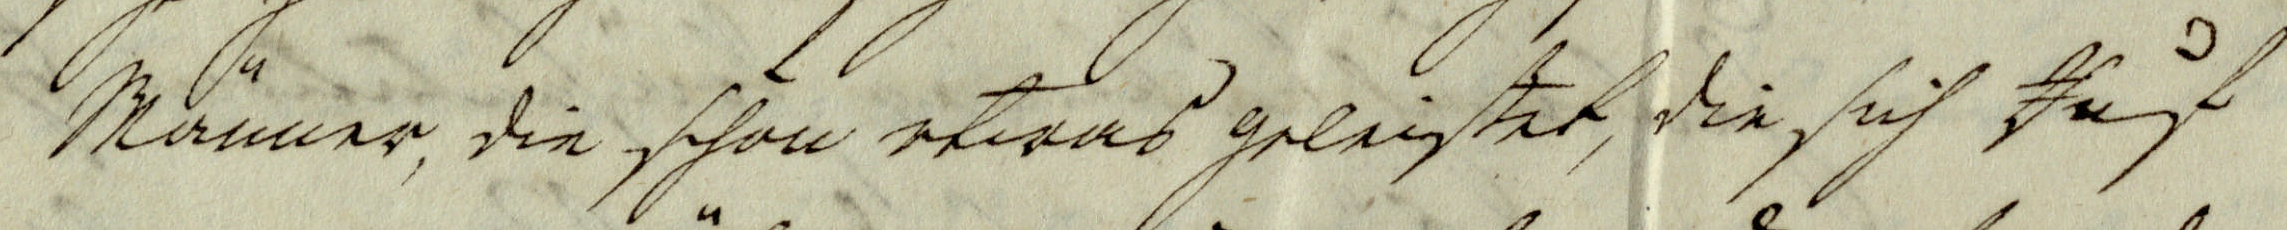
Männer, die schon etwas geleistet, die sich Ruf
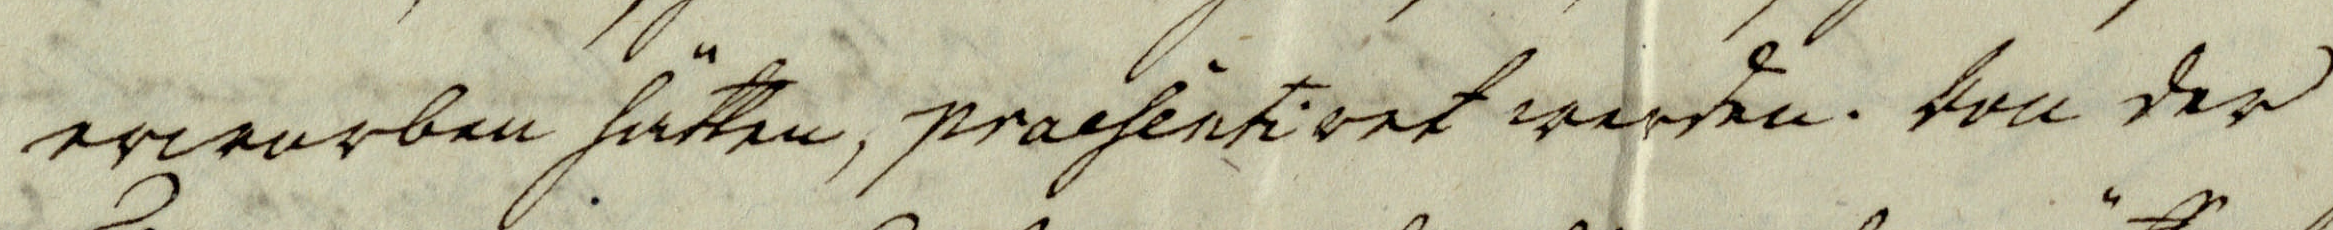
erworben hätten, praesentiret werden. Von der
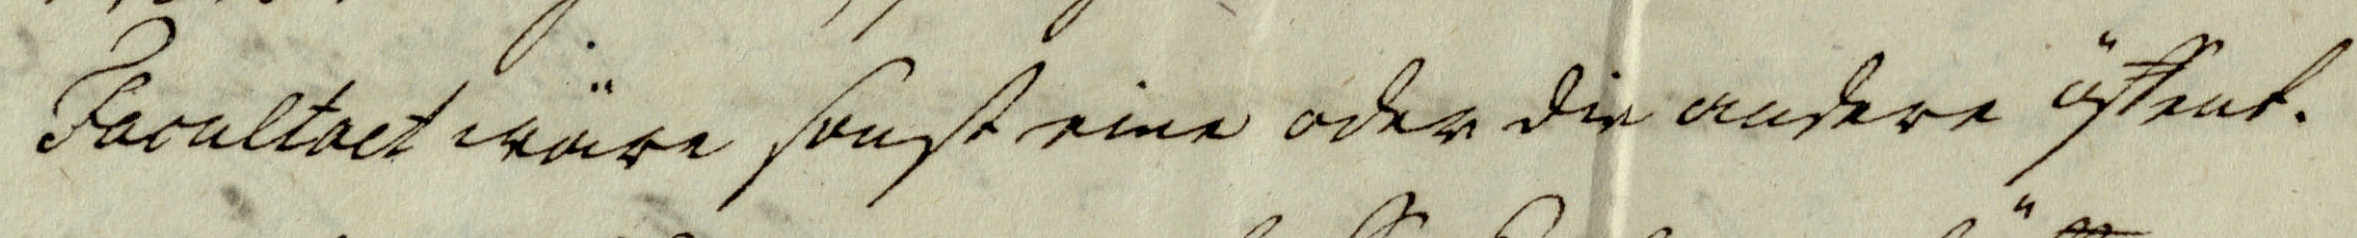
Facultät wäre sonst eine oder die andere öffent¬
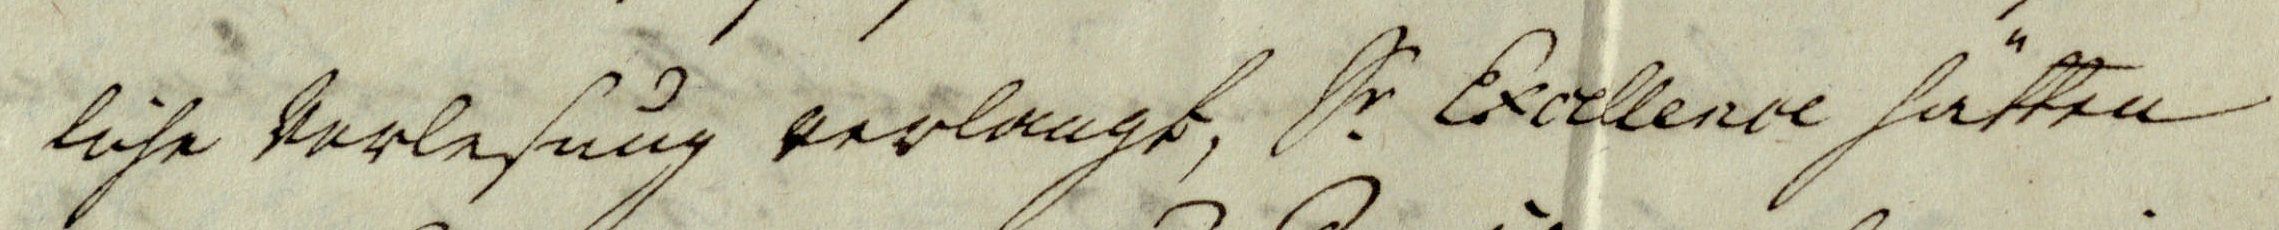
liche Vorlesung verlangt, Sr. Excellence hätten
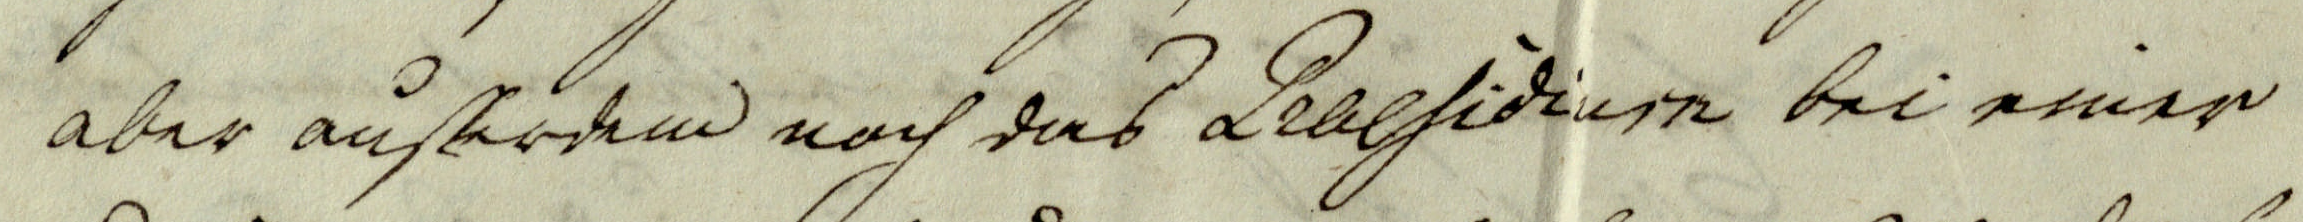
aber ausserdem noch das Praesidium bei einer
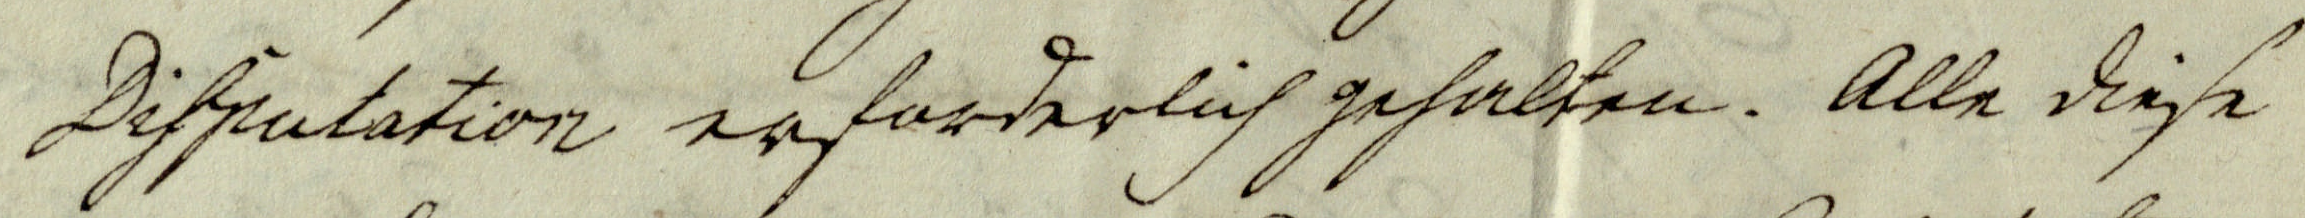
Disputation erforderlich gehalten. Alle diese
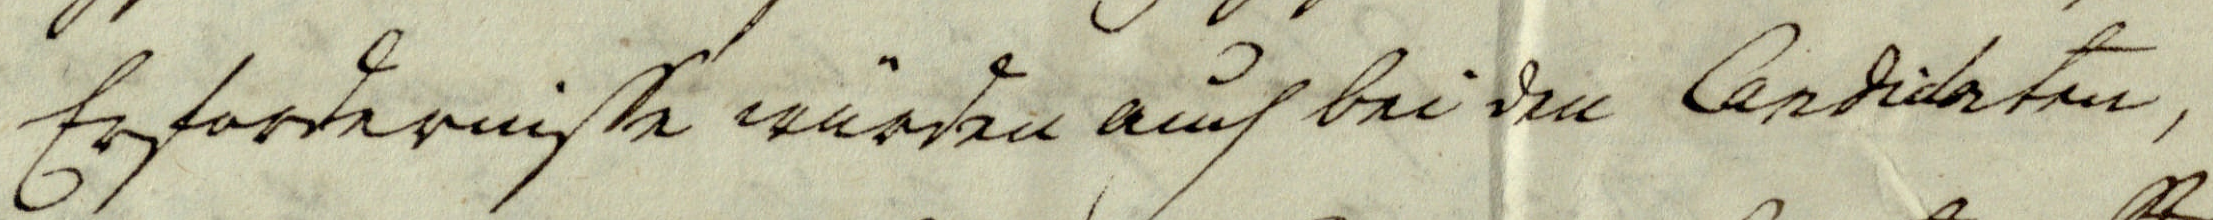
Erfordernisse würden auch bei den Candidaten,
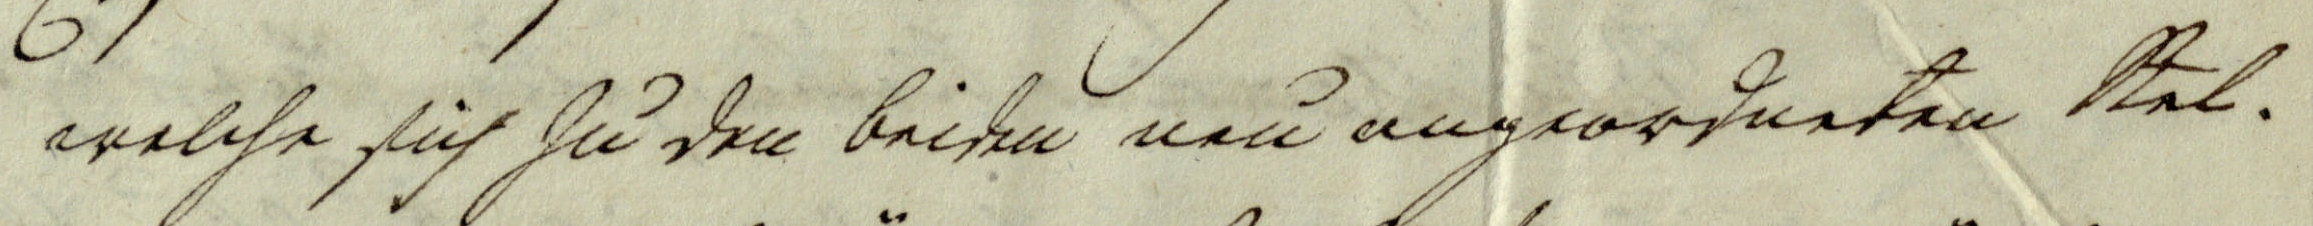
welche sich zu den beiden neu angeordneten Stel¬
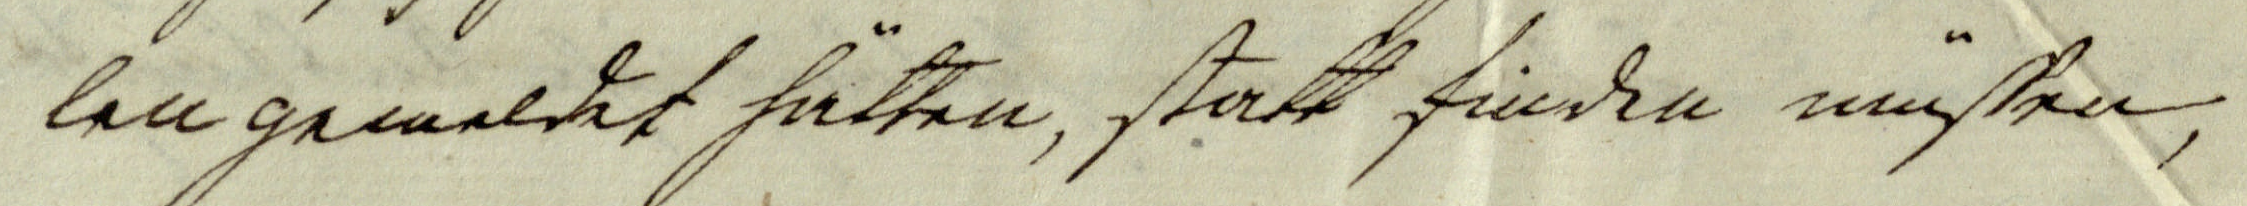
len gemeldet hätten, statt finden müssten,
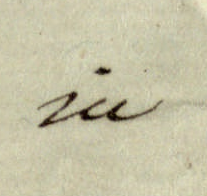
in
